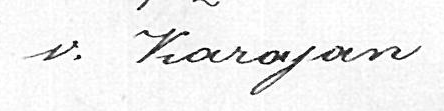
v. Karajan
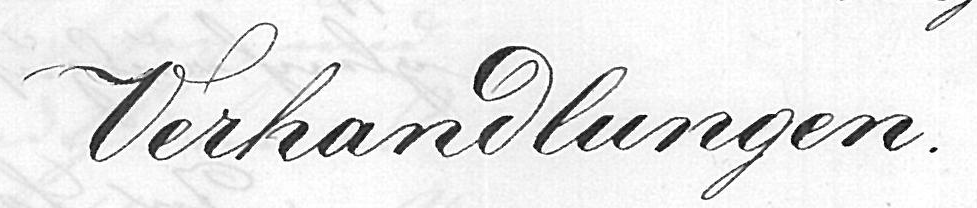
Verhandlungen
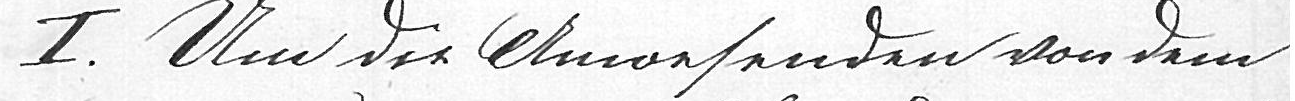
I. Um die Anwesenden von dem
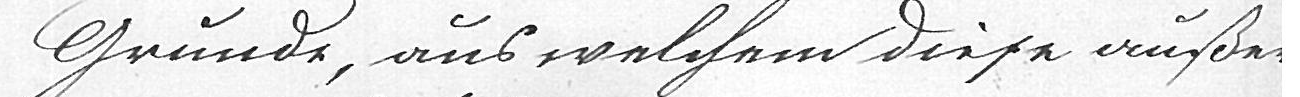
Grunde, aus welchem diese außer-
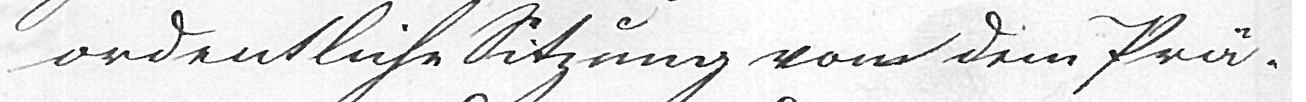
ordentliche Sitzung von dem Prä-
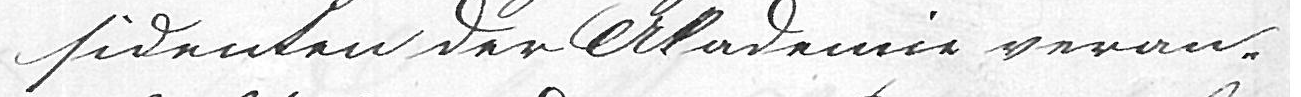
sidenten der Akademie veran-
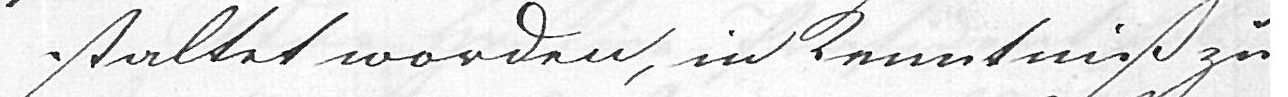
staltet worden, in Kenntniß zu
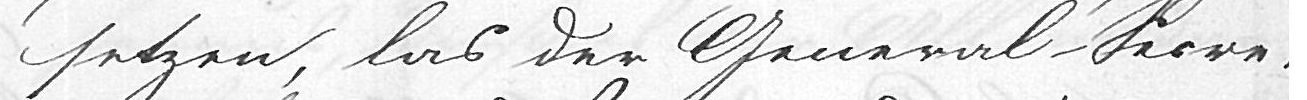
setzen, las der General-Secre-
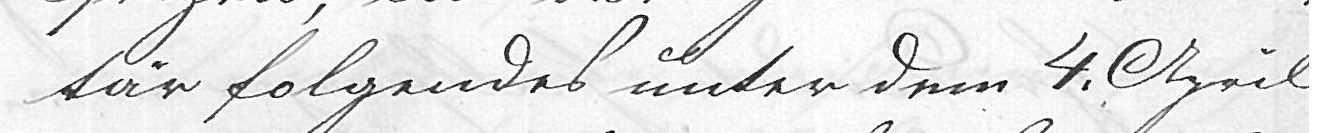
tär folgendes unter dem 4. April
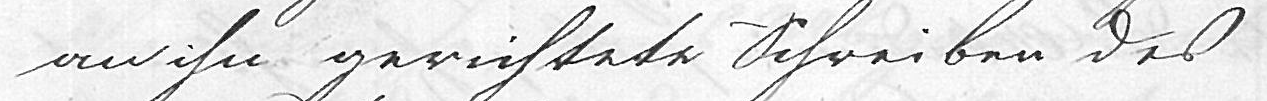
an ihn gerichtete Schreiben des
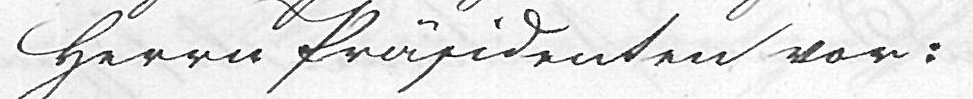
Herrn Präsidenten vor:
